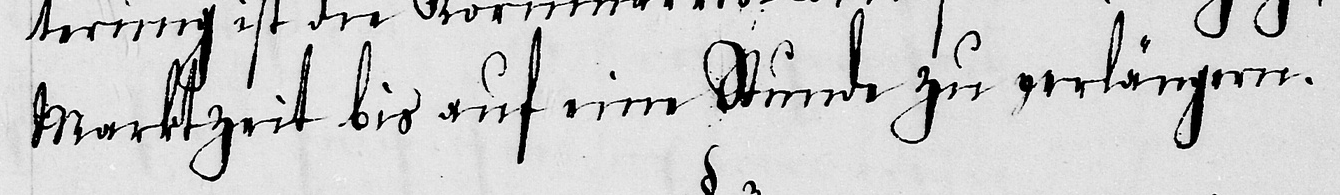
Marktzeit bis auf eine Stunde zu verlängern.
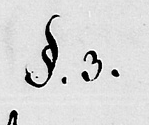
§.3.
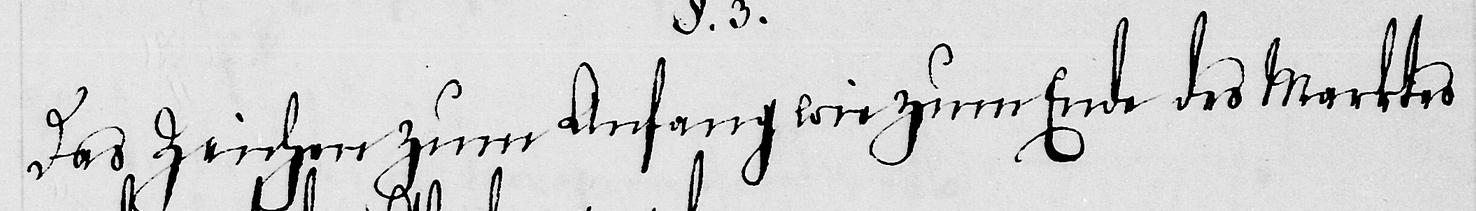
Das Zeichen zum Anfang wie zum Ende des Marktes
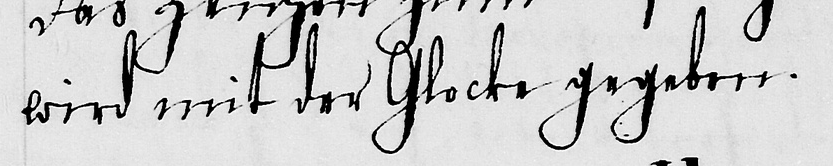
wird mit der Glocke gegeben.
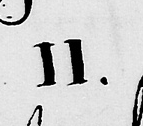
II.
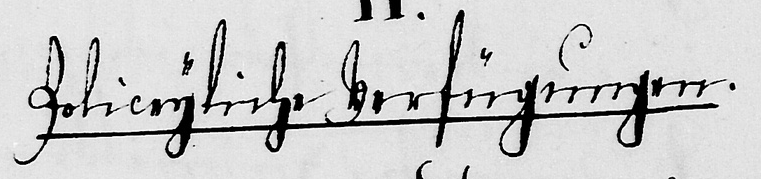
Policeyliche Verfügungen.
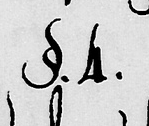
§.4.
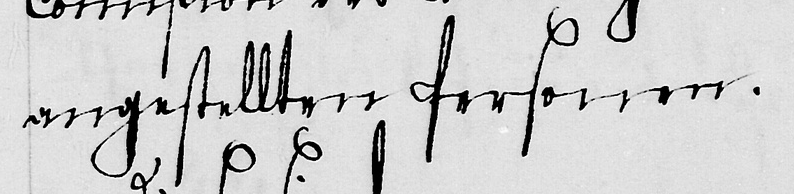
angestellten Personen.
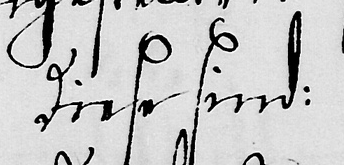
Diese sind:
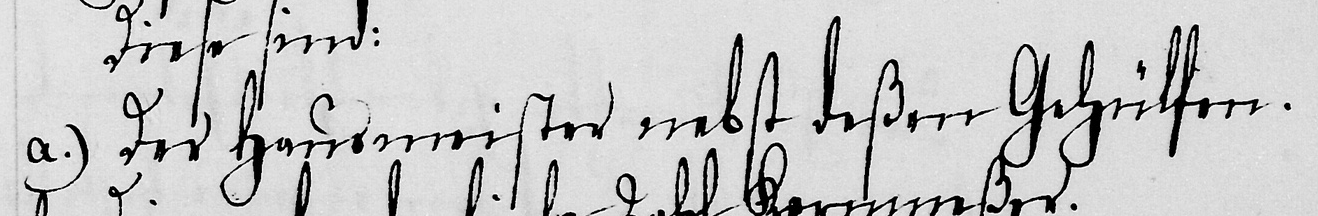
a.) Der Hausmeister nebst deßen Gehülfen.
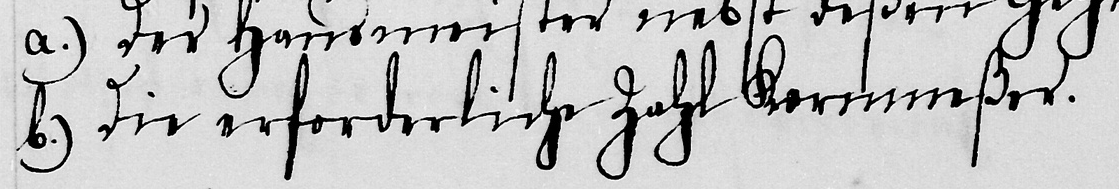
b.) Die erforderliche Zahl Kornmeßer.
